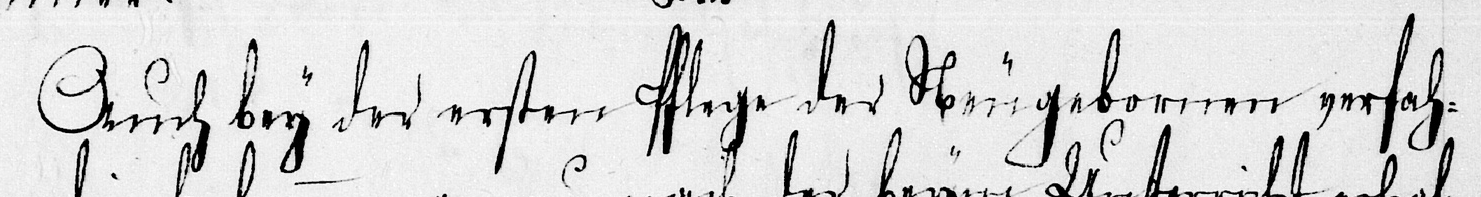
Auch bey der ersten Pflege der Neugeborenen verfah¬
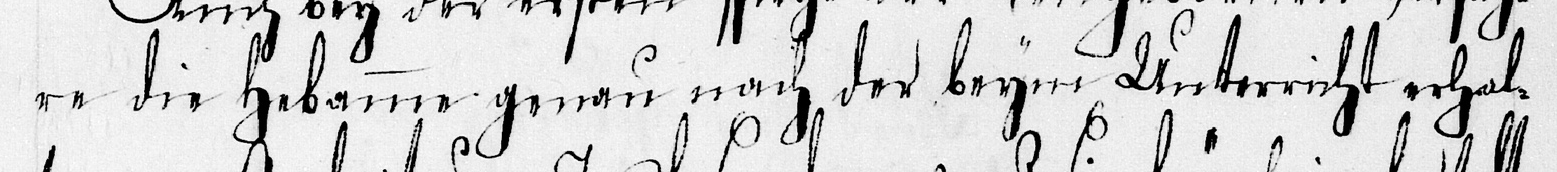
re die Hebamme genau nach der beym Unterricht erhal¬
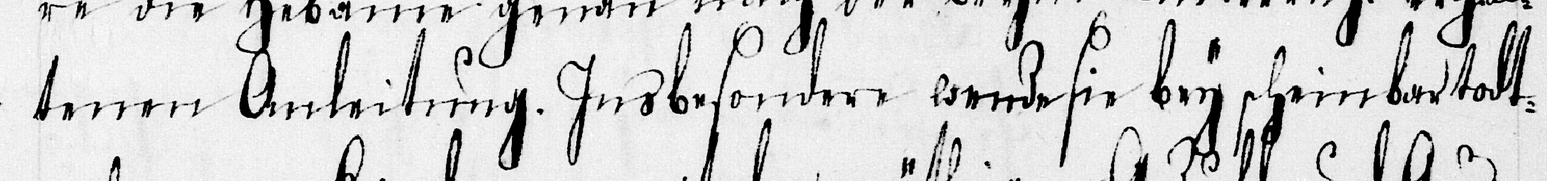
tenen Anleitung. Insbesondere wende sie bey scheinbar todt¬
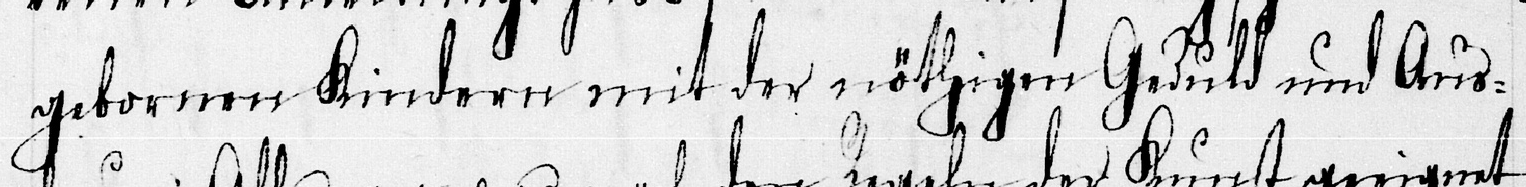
geborenen Kindern mit der nöthigen Geduld und Aus¬
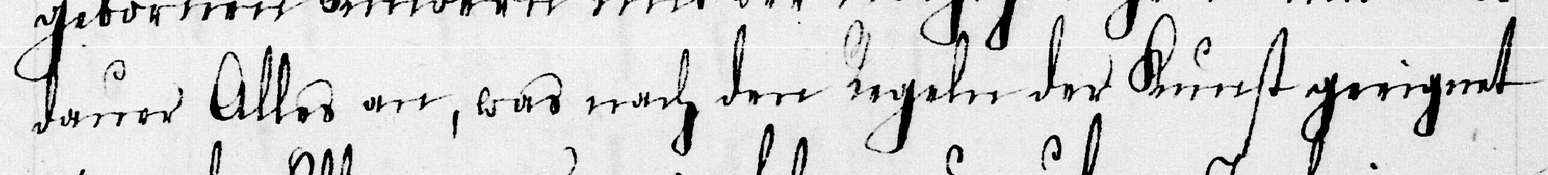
dauer Alles an, was nach den Regeln der Kunst geeignet
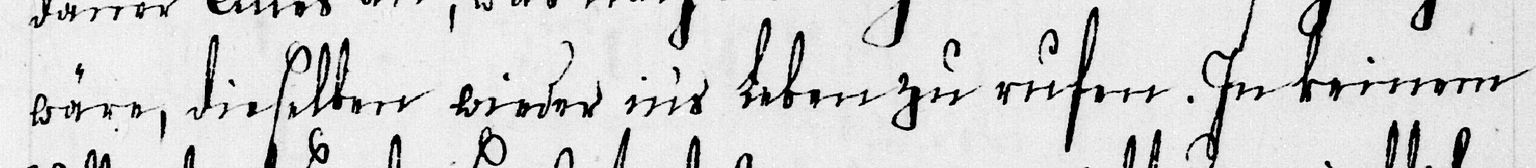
wäre, dieselben wieder in’s Leben zu rufen. In keinem
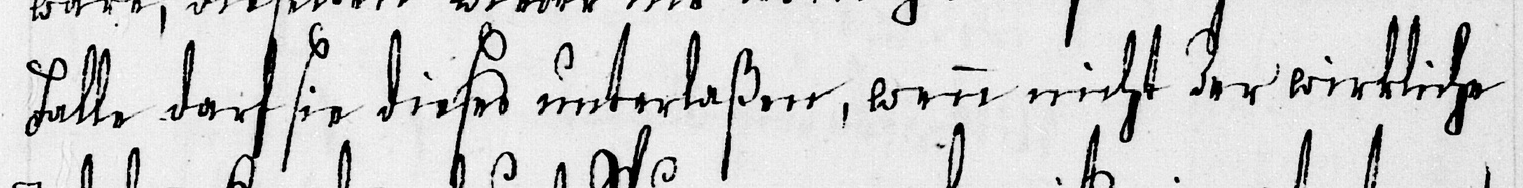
Falle darf sie dieses unterlaßen, wenn nicht der wirkliche
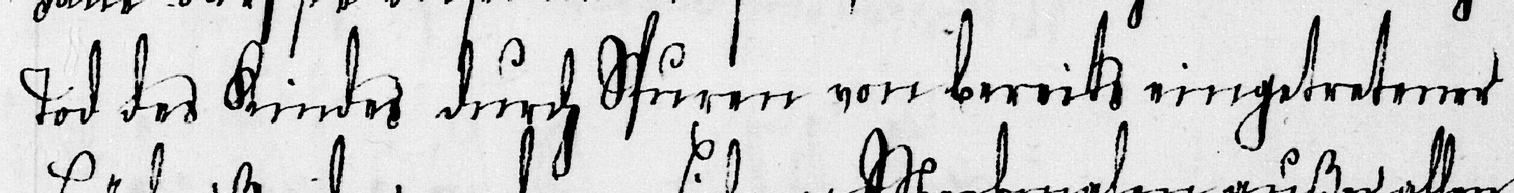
Tod des Kindes durch Spuren von bereits eingetretener
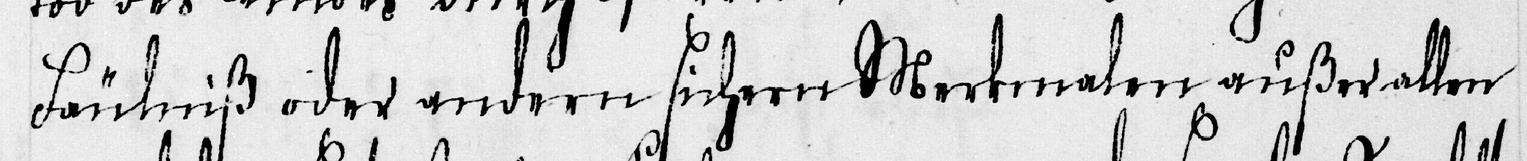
Fäulniß oder andern sichern Merkmalen außer allen
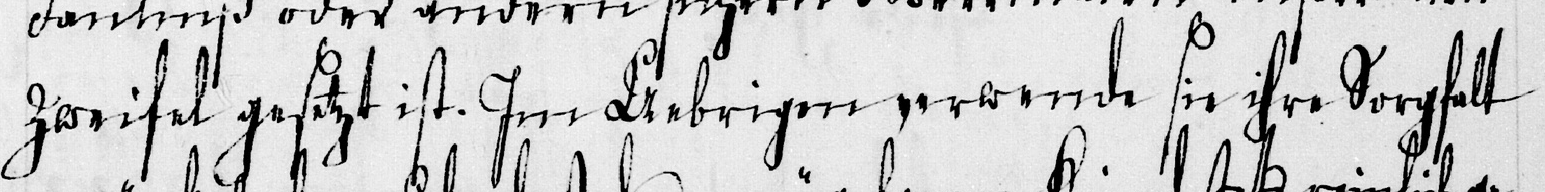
Zweifel gesetzt ist. Im Uebrigen verwende sie ihre Sorgfalt
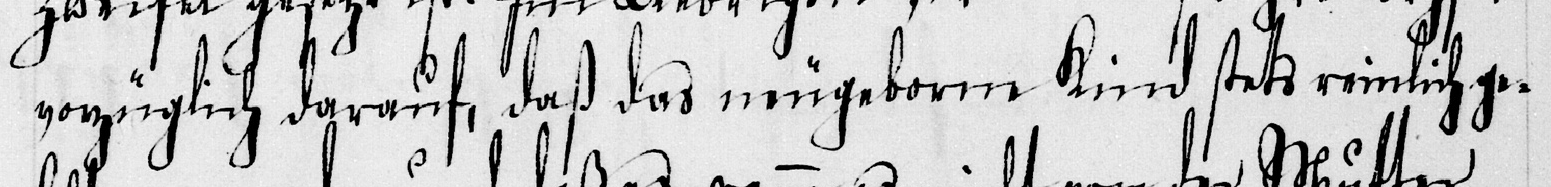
vorzüglich darauf, daß das neugeborene Kind stets reinlich ge¬
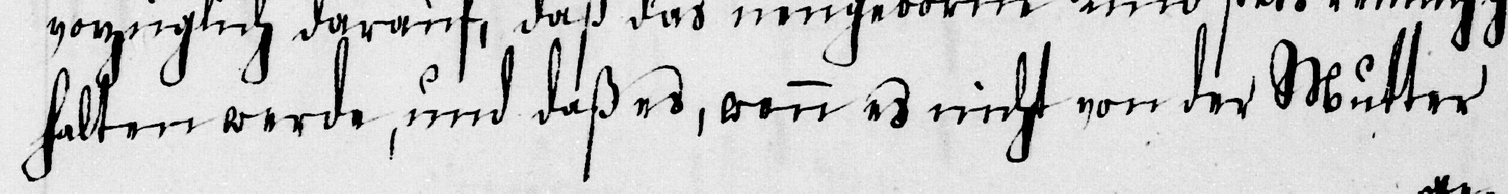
halten werde, und daß es, wenn es nicht von der Mutter
